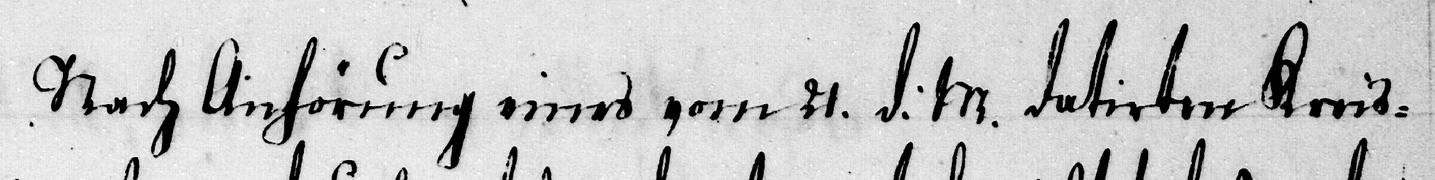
Nach Anhörung eines vom 21. d. M. datirten Kreis¬
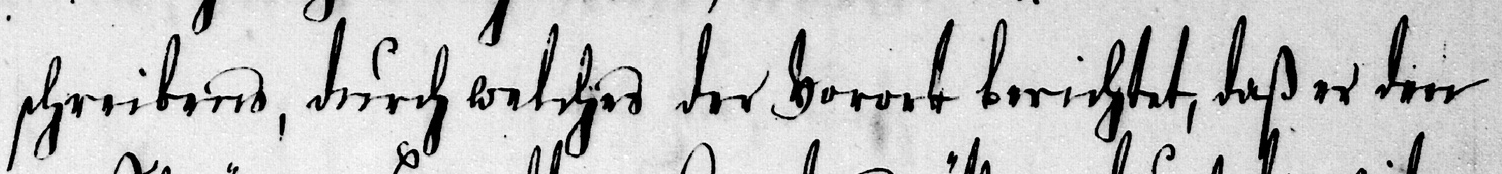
schreibens, durch welches der Vorort berichtet, daß er den
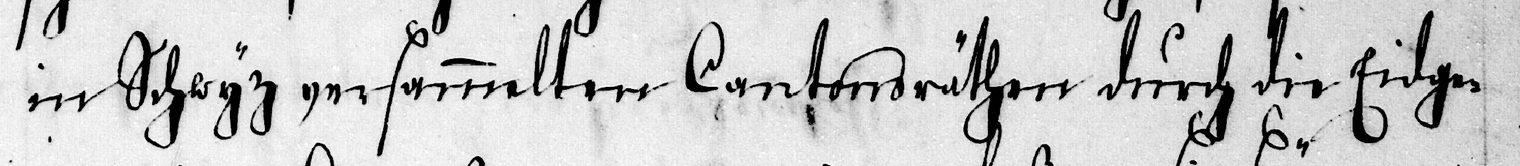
in Schwyz versammelten Cantonsräthen durch die Eidge¬
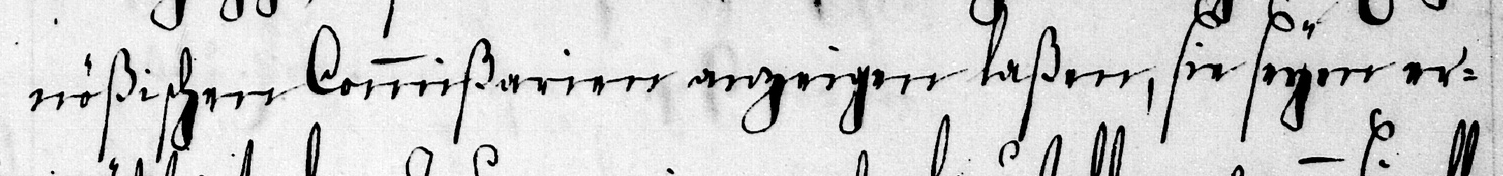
nößischen Commißarien anzeigen laßen, sie seyen er¬
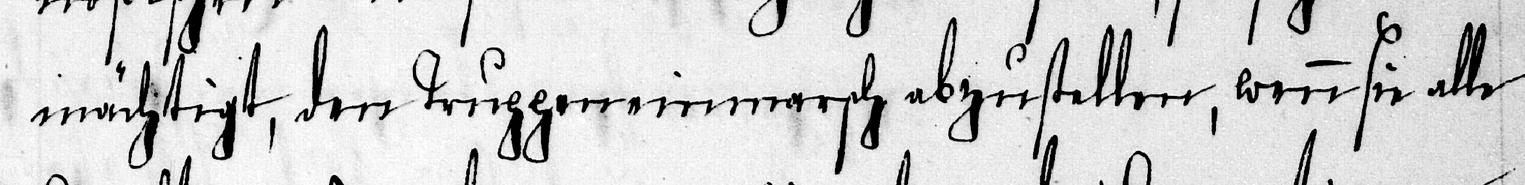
mächtigt, den Truppeneinmarsch abzustellen, wenn sie al¬
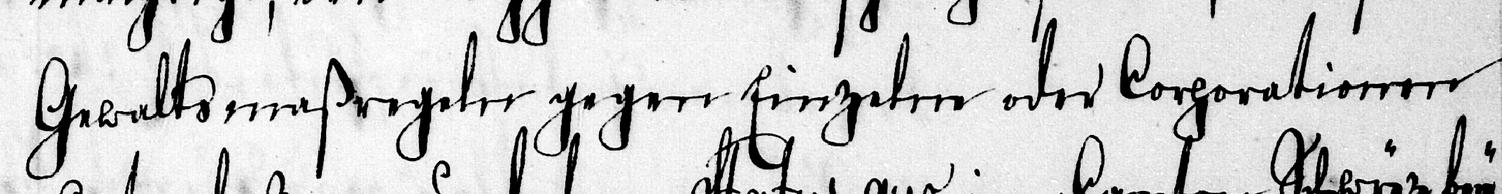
Gewaltsmaßregeln gegen Einzelne oder Corporationen
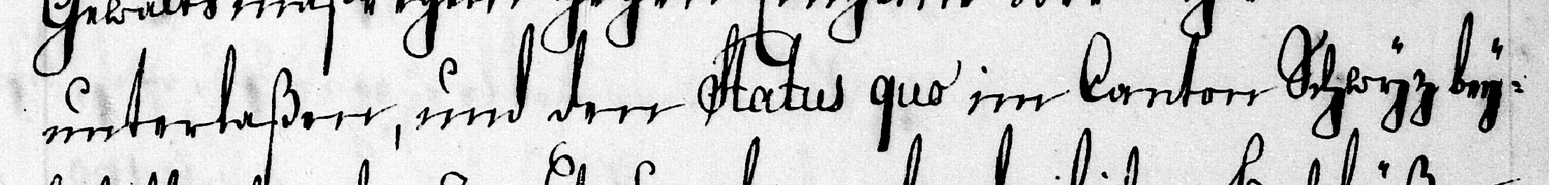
unterlaßen, und den Status quo im Canton Schwyz bey¬
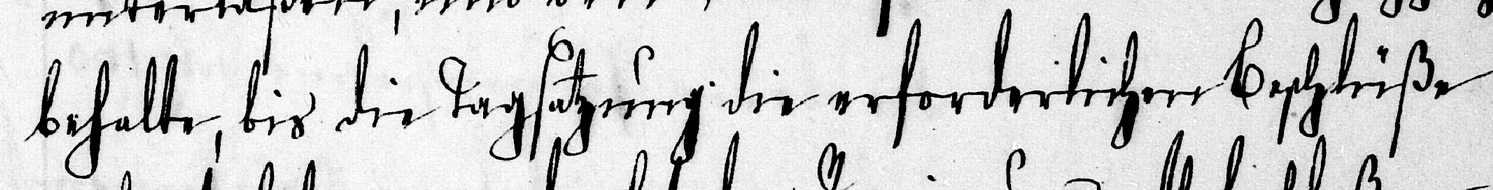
behalte, bis die Tagsatzung die erforderlichen Beschlüße
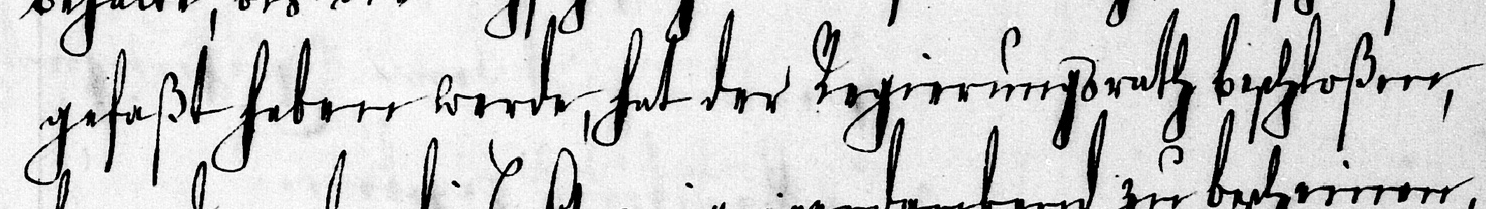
gefaßt haben werde, hat der Regierungsrath beschloßen,
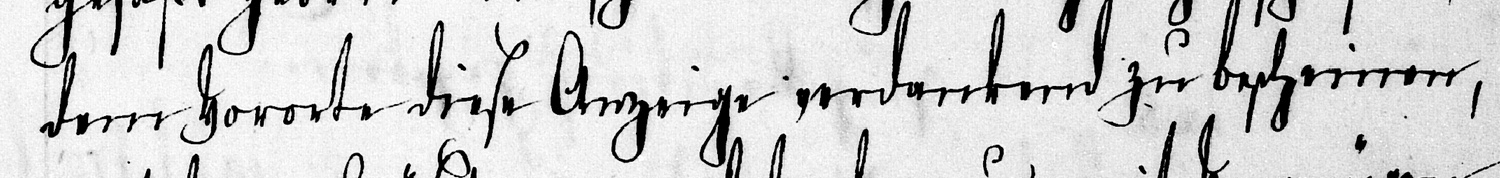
dem Vororte diese Anzeige verdankend zu bescheinen,
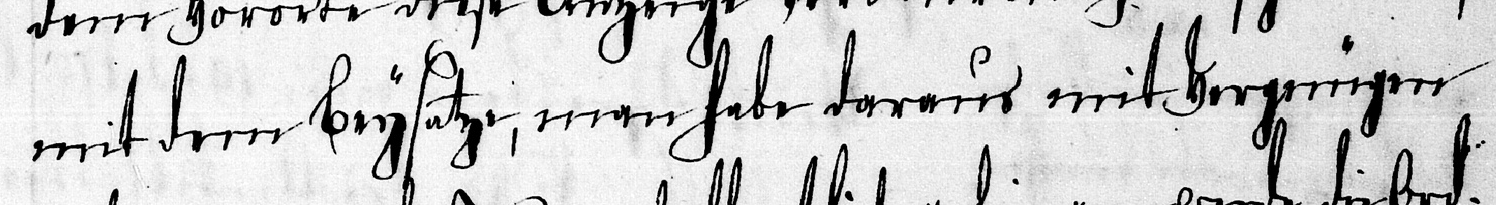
mit dem Beysatze, man habe daraus mit Vergnügen
